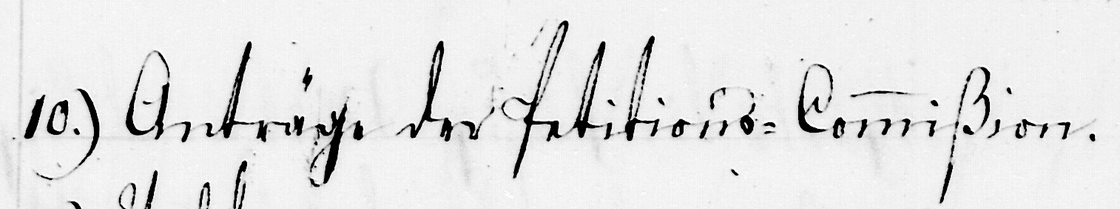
10.) Anträge der Petitions-Commißion.
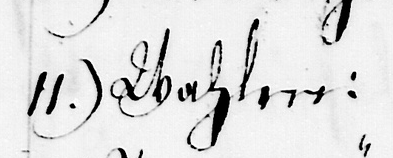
11.) Wahlen:
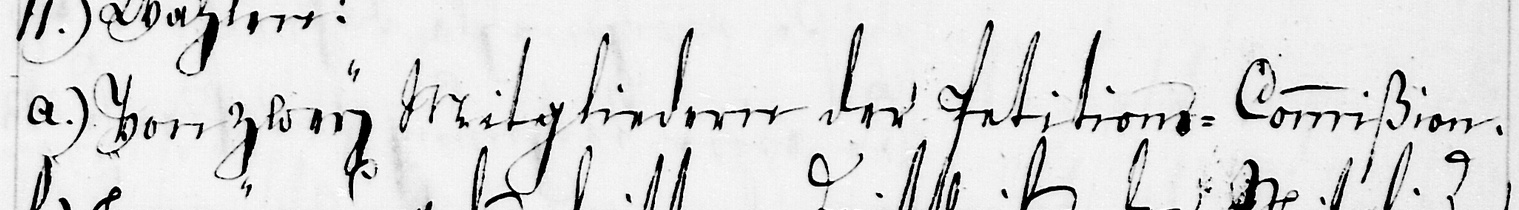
a.) Von zwey Mitgliedern der Petitions-Commißion.
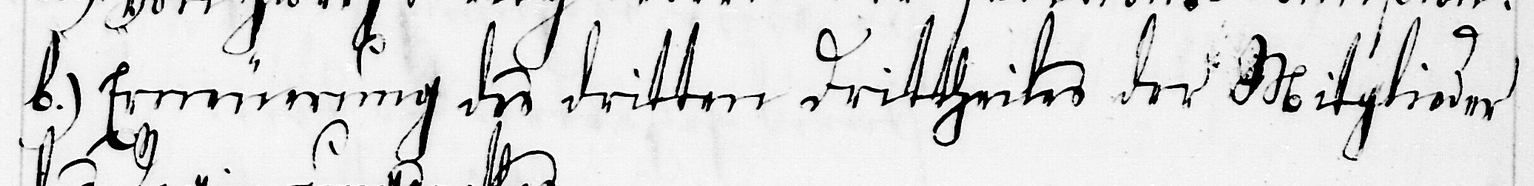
b.) Erneuerung des dritten Drittheiles der Mitglieder
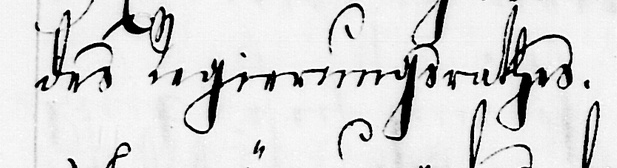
des Regierungsrathes.
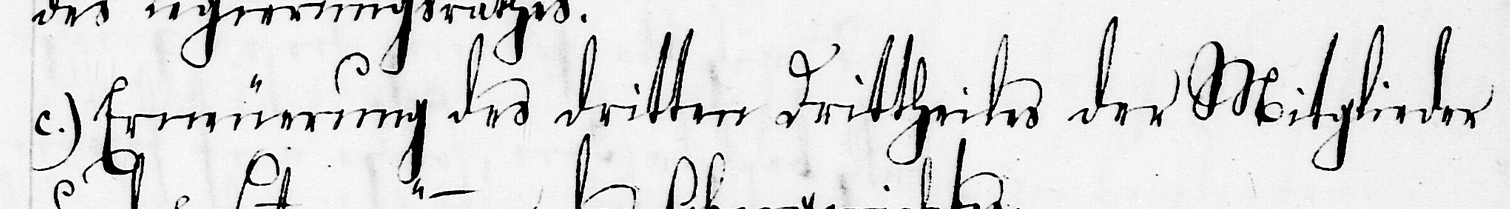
c.) Erneuerung des dritten Drittheiles der Mitglieder
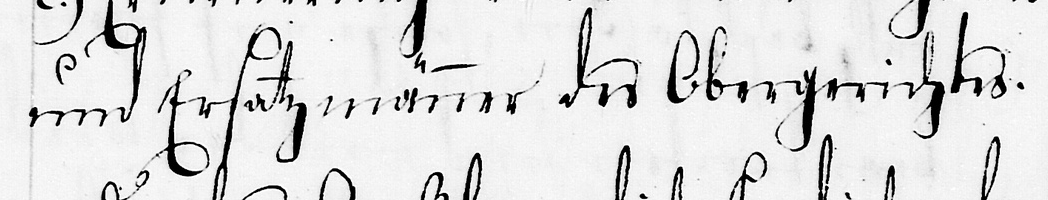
und Ersatzmänner des Obergerichtes.
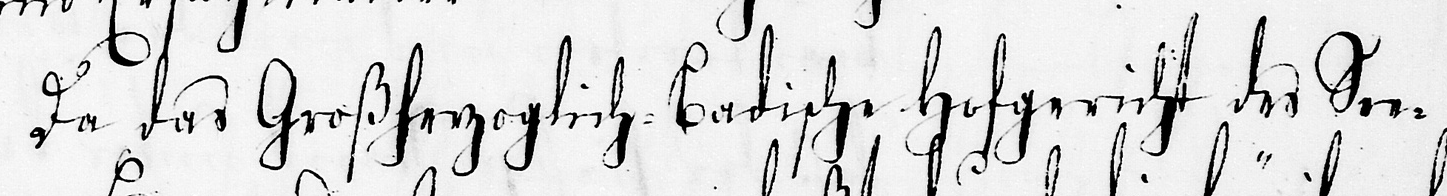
Da das Großherzoglich-Badische Hofgericht des See¬
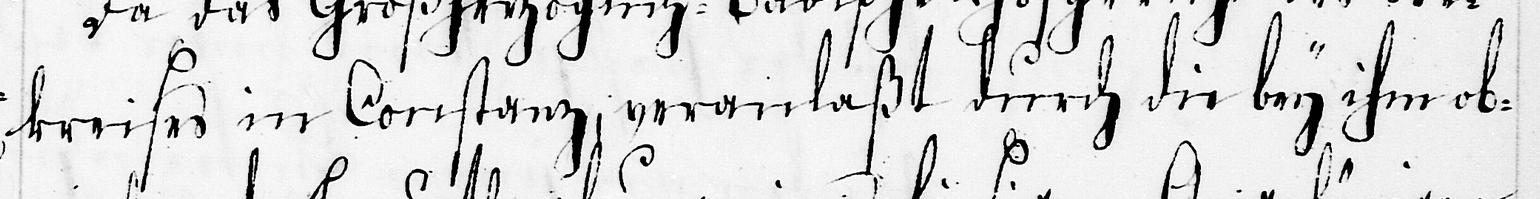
kreises in Constanz, veranlaßt durch die bey ihm obs¬
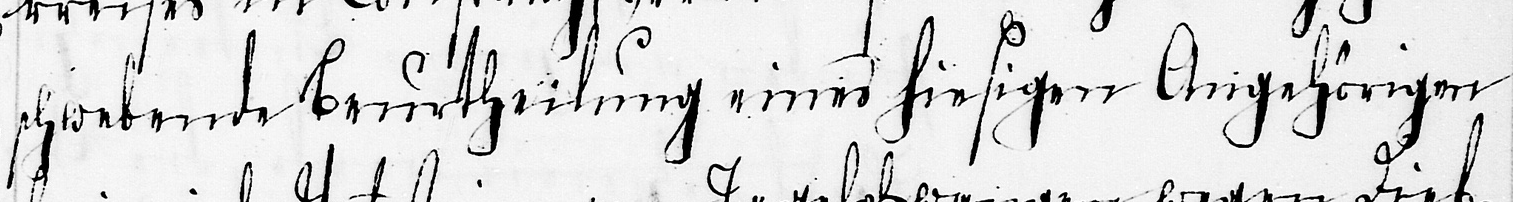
chwebende Beurtheilung eines hiesigen Angehörigen
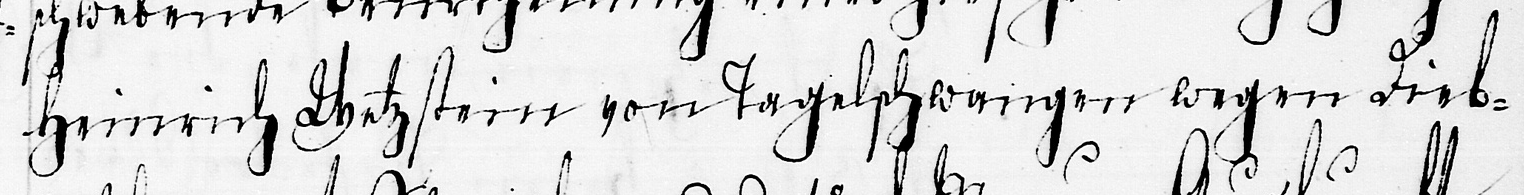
Heinrich Wetzstein von Tagelschwangen wegen Dieb¬
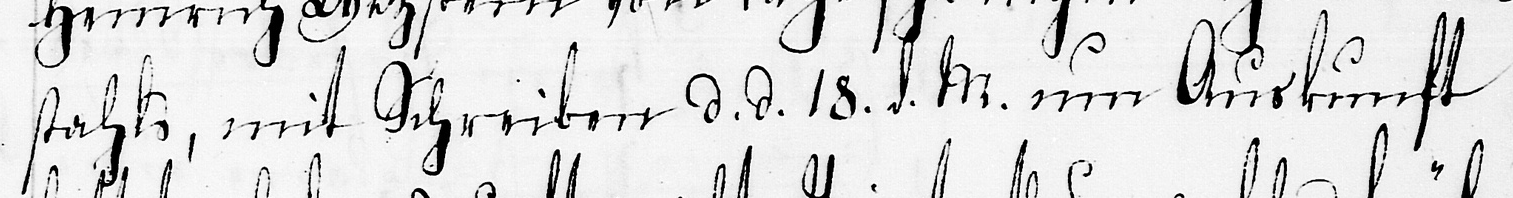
stahls, mit Schreiben d. d. 18. d. M. um Auskunft
